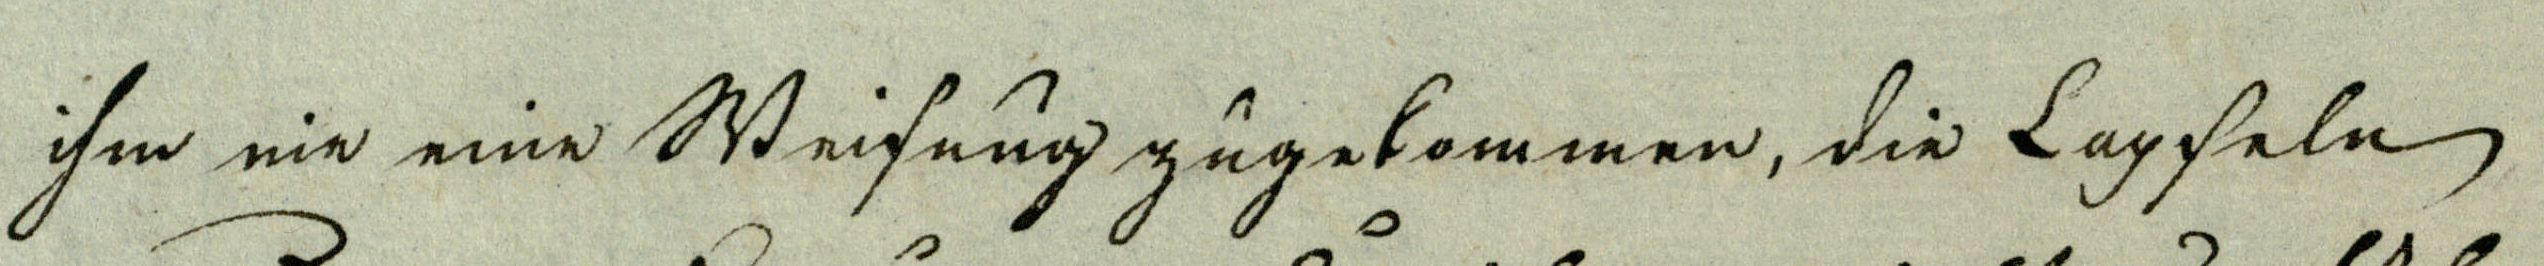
ihm nie eine Weisung zugekommen, die Capseln
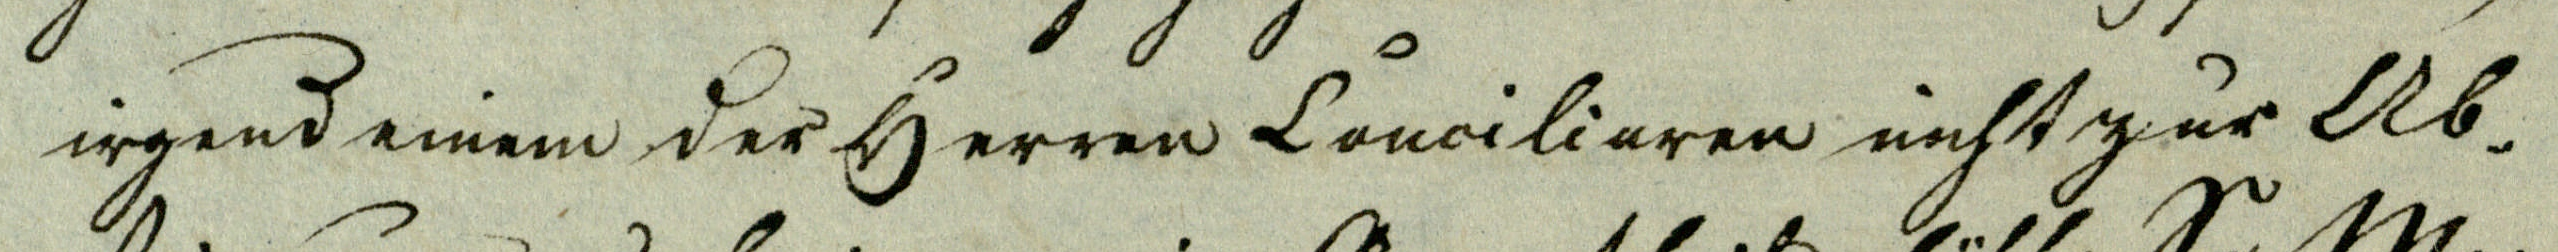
irgend einem der Herren Conciliaren nicht zur Ab¬
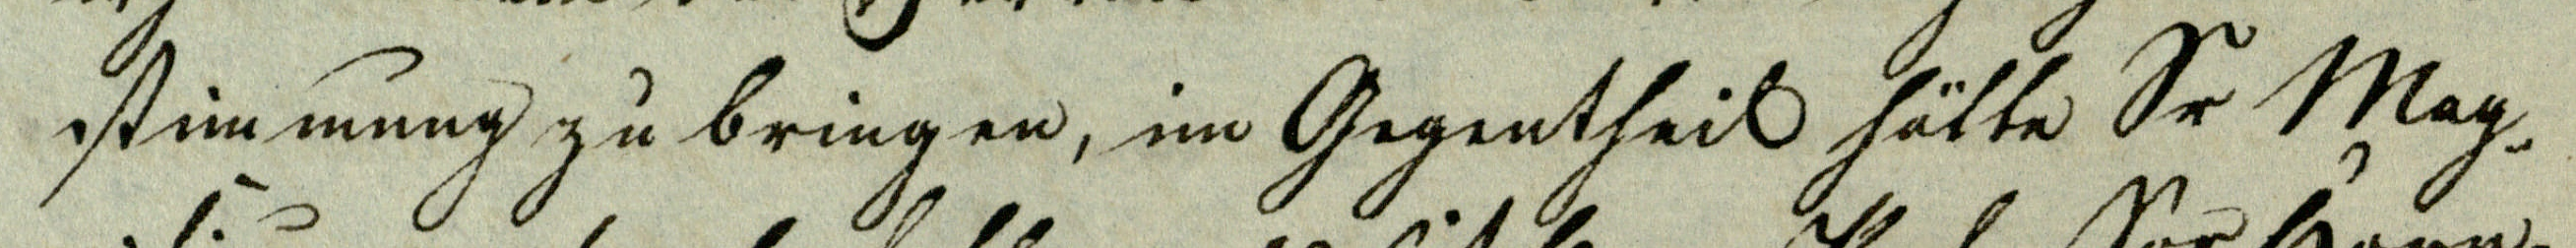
stimmung zu bringen, im Gegentheil hätte Sr Mag¬
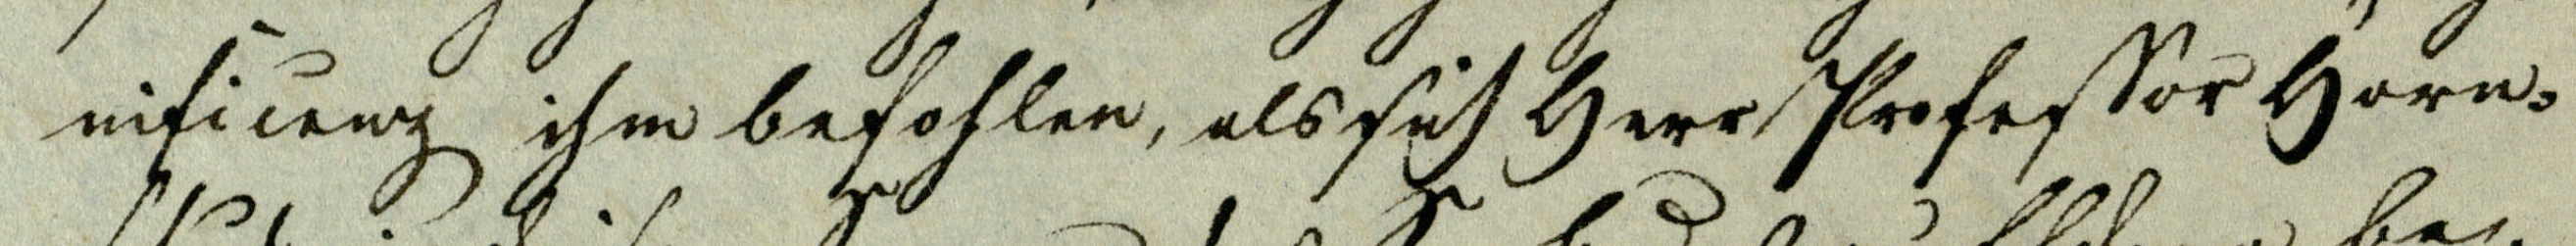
nificenz ihm befohlen, als sich Herr Professor Horn¬
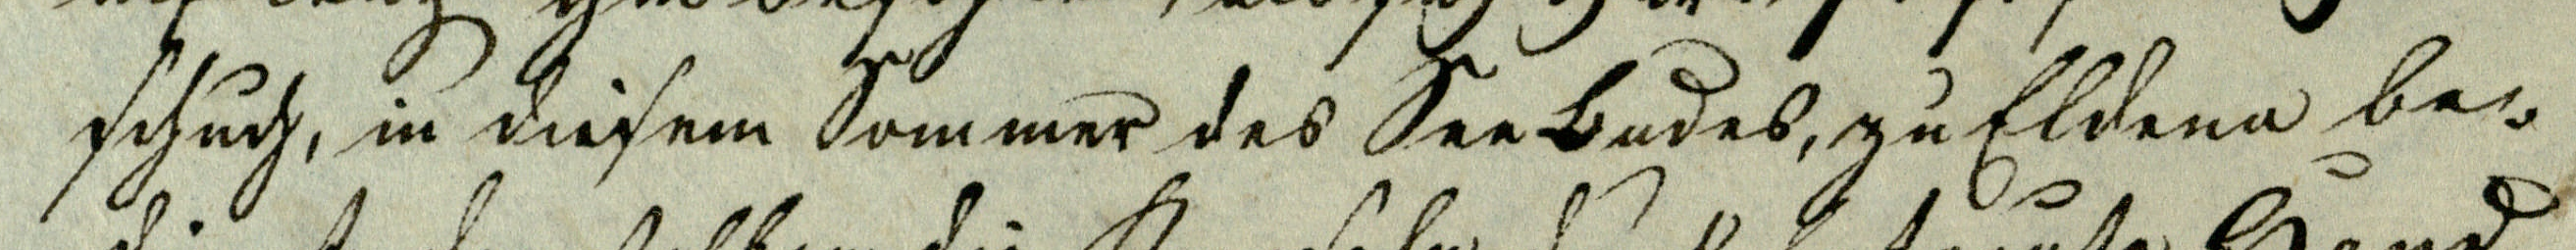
schuch, in diesem Sommer des Seebades, zu Eldena be¬
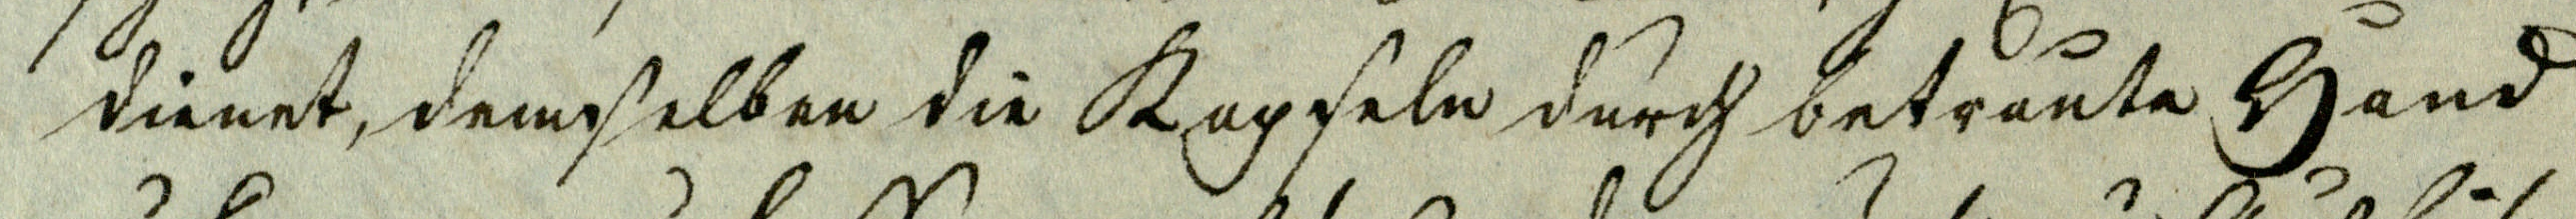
dienet, demselben die Kapseln durch betraute Hand
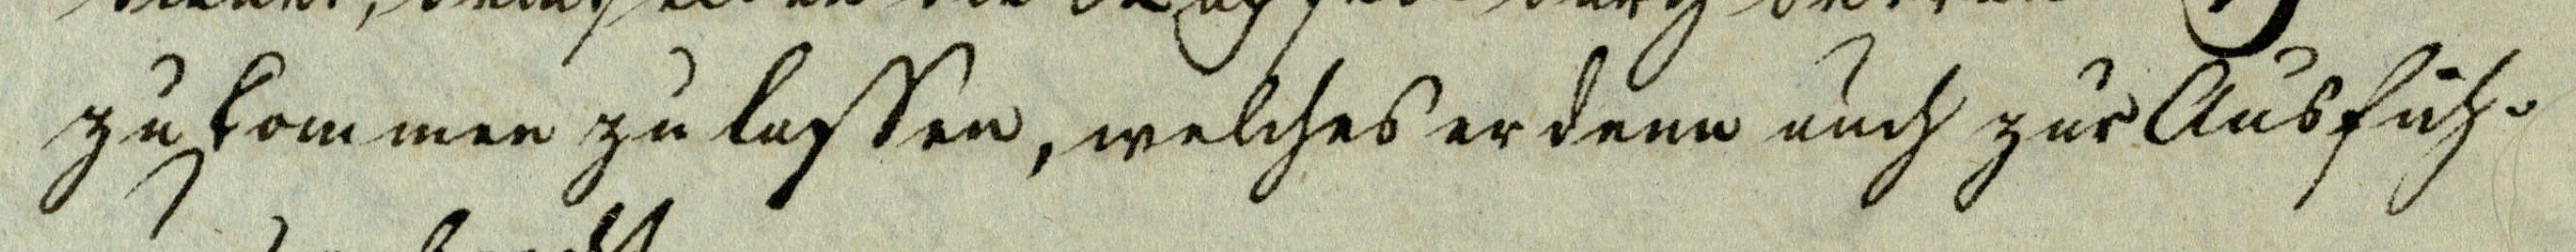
zukommen zu lassen, welches er denn auch zur Ausfüh¬
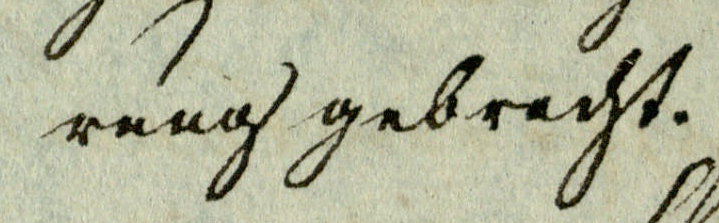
rung gebracht.
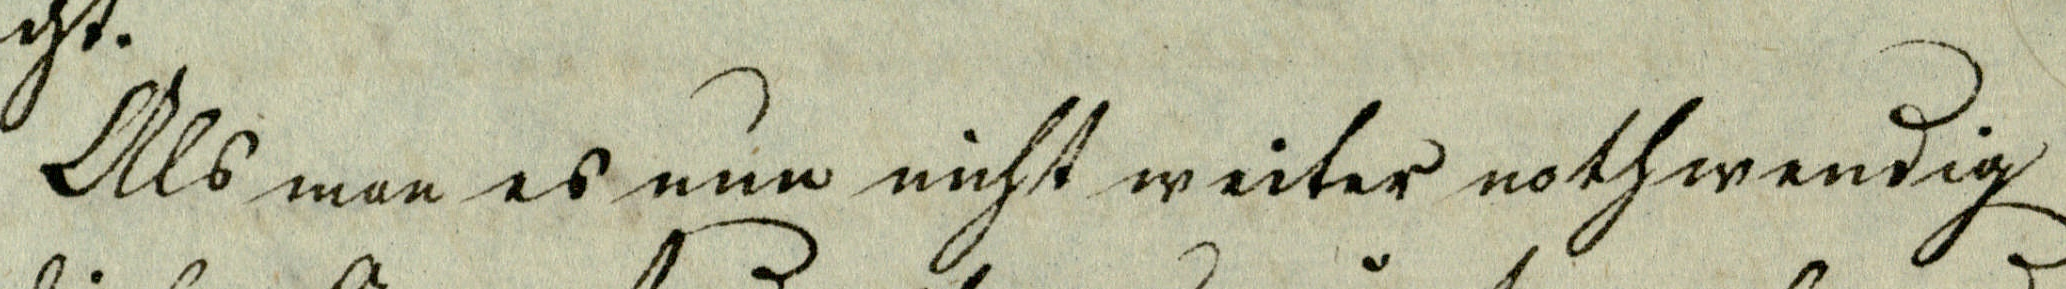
Als man es nun nicht weiter nothwendig
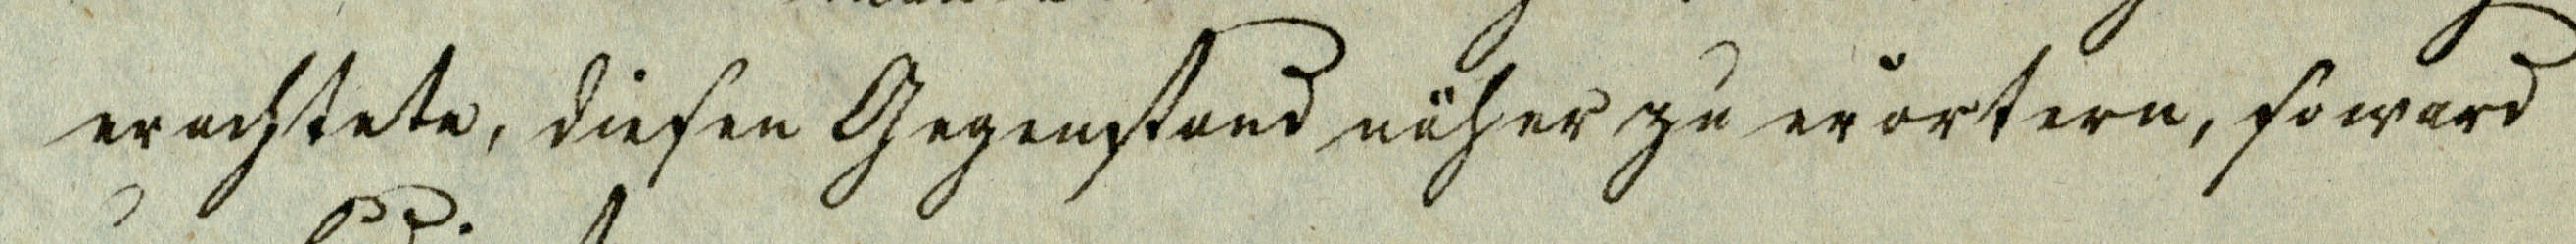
erachtete, diesen Gegenstand näher zu erörtern, so ward
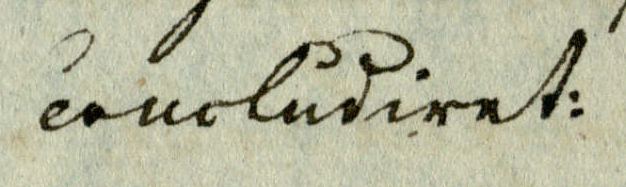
concludiret:
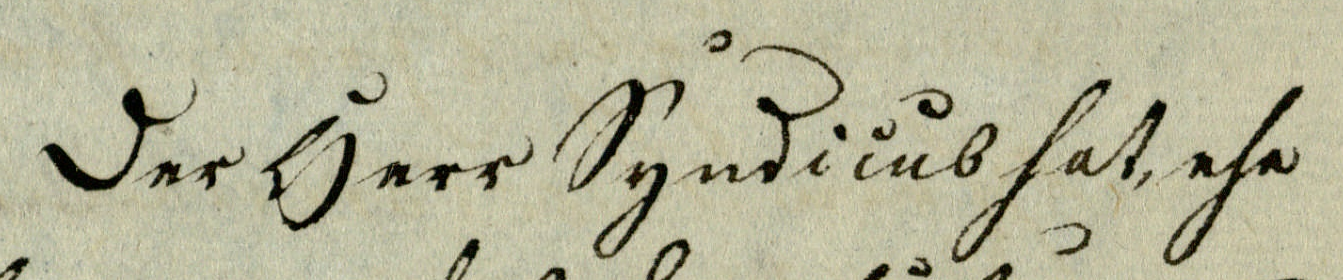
Der Herr Syndicus hat, ehe
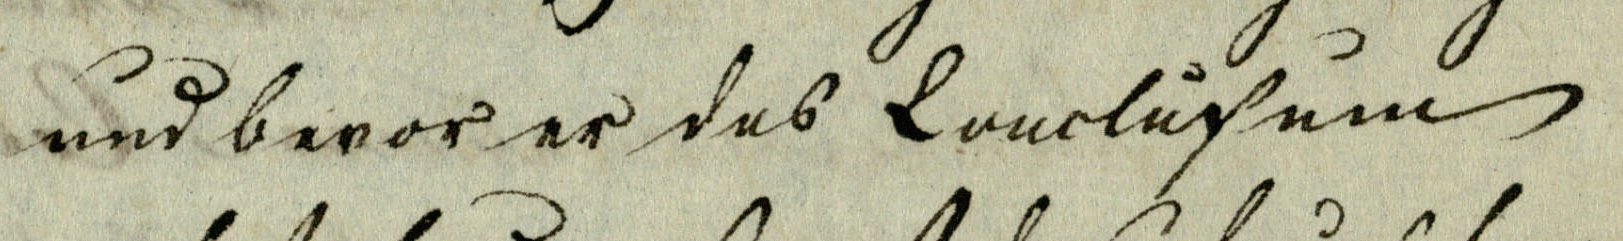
und bevor er das Conclusum
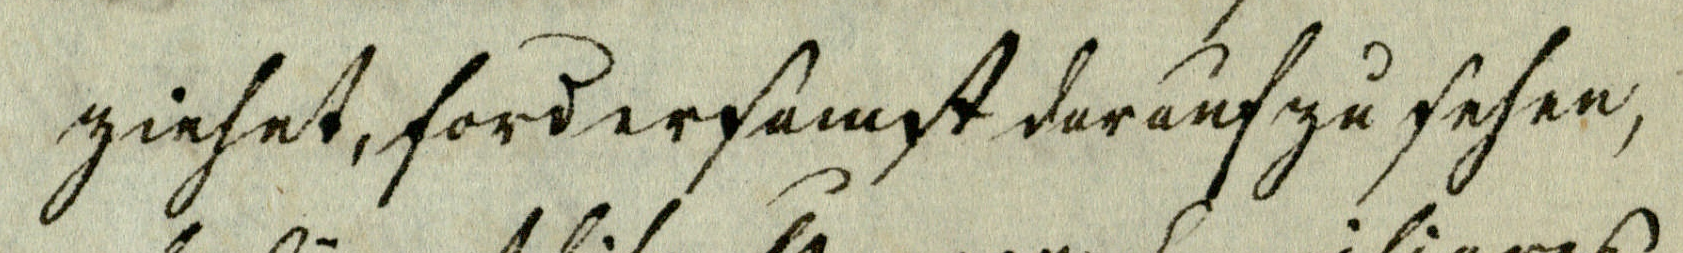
ziehet, fordersamst darauf zu sehen,
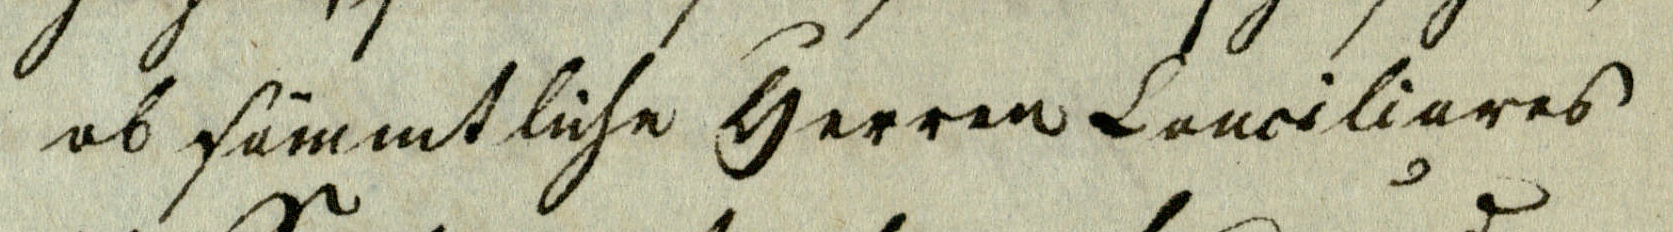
ob sämmtliche Herren Cociliares
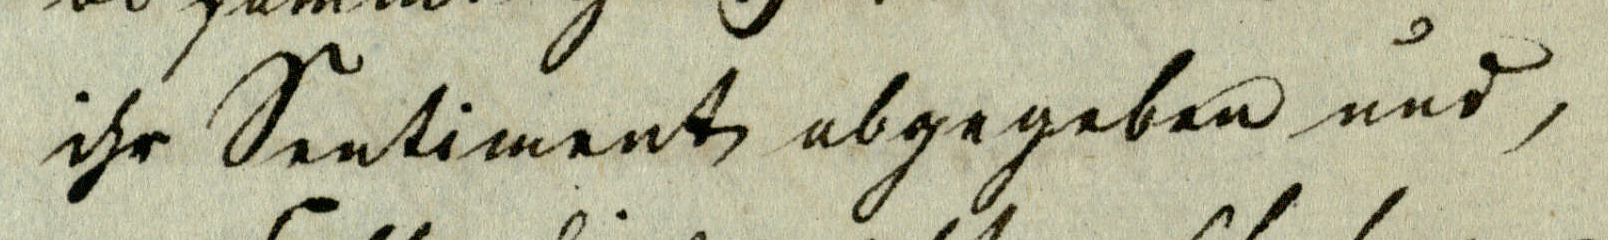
ihr Sentiment abgegeben und,
